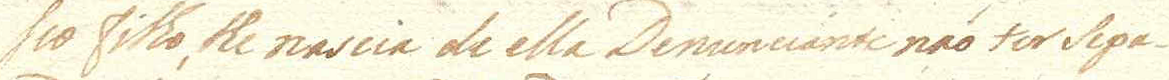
seo filho, lhe nascia de ella Denunciante não ter sepa
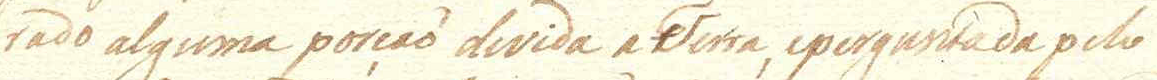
rado alguma porçaõ devida a Terra, e perguntada pelo
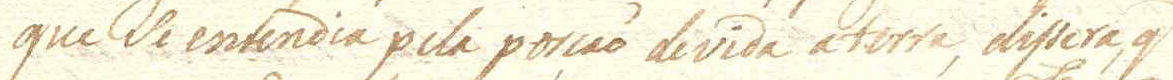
que se entendia pela porçaõ de vida a terra, dissera, q̄
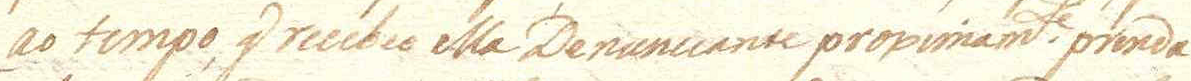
ao tempo, q̄ recebeo ella Denunciante proximam.te prenda
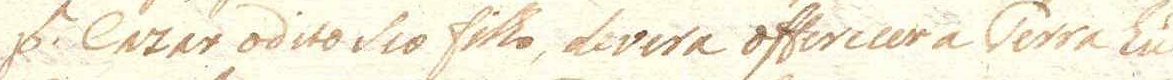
p.a Cazar o dito seo filho, devera offerecer a Terra hū
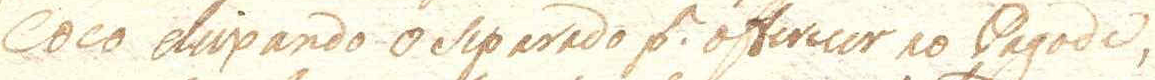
coco deixando o separado p.a offerecer ao Pagode,
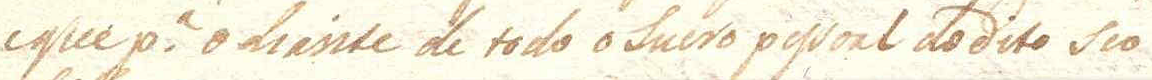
e que p.a o diante de todo o lucro pessoal do dito seo
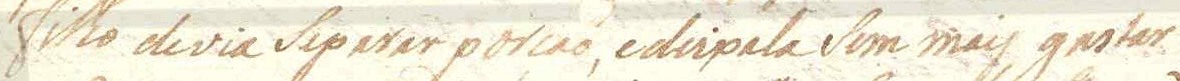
filho devia separar porçaõ, e deixala sem mais gastar
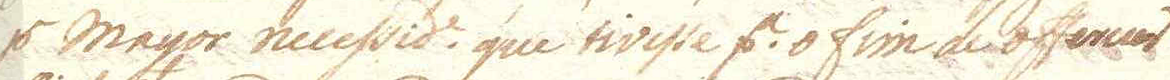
p mayor necessid.e que tivesse p.a o fim de offerecer
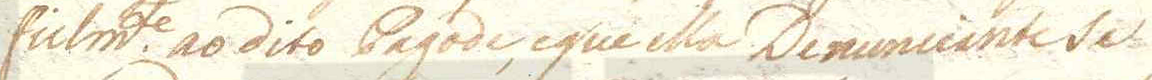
fielm.te ao dito Pagode, e que ella Denunciante se
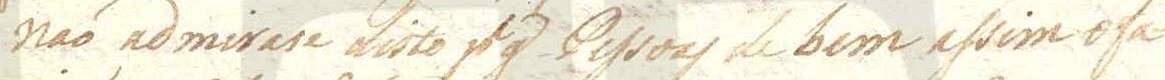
nao admirase disto po q̄ Pessoas de bem assim o fa
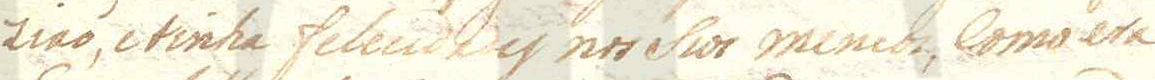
ziaõ, e tinha felecidades nos Seos meneos, Como era
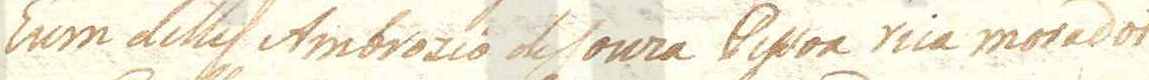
hum delles Ambrozio de souza Pessoa rico morador
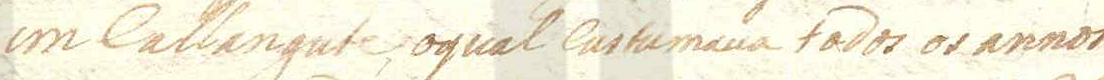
em Callangute, o qual custumaua todos os annos
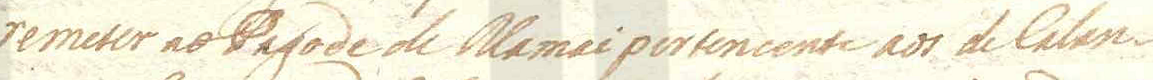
remeter ao Pagode de Mamai pertencente aos de Calan
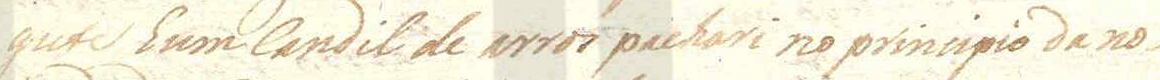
gute hum Candil de arros pachari no principio da no
